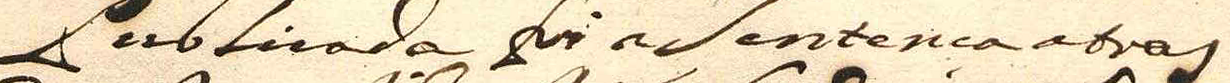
Publicada foi a Sentença atras
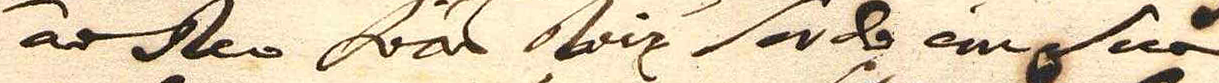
ao Reo Ioaõ Roiz̄ Sordo em sua
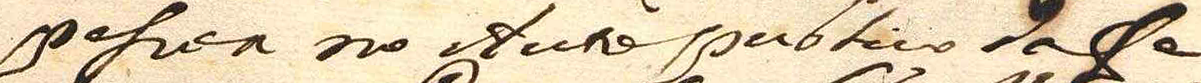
pessoa no Auto publico da fe
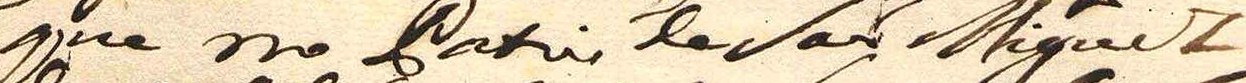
que no Patio de Saõ Miguel
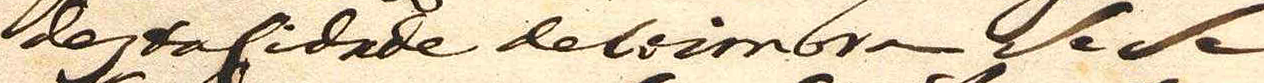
desta Cidade de coimbra se se
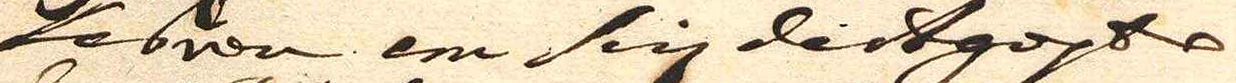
lebrou, em seis de Agosto
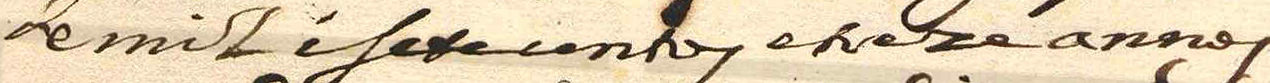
de mil e setecentos e treze annos
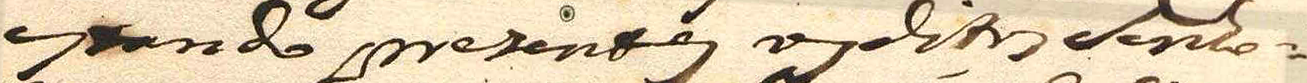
estando prezentes os ditos Senho
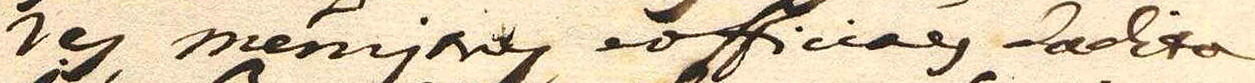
res, menistros, e officiaes da dita
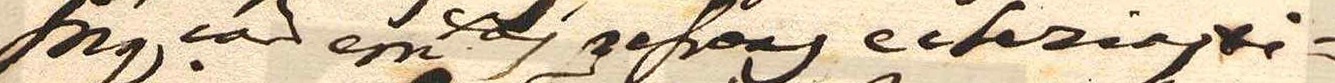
Inq.çaõ e m.tas pessoas ecleziasti
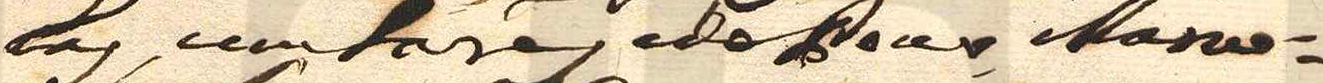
cas, ceculares e do Pouo, Mano
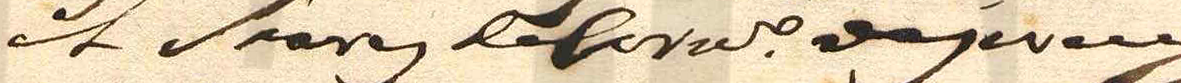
el soares de Caru.o o escreuj
